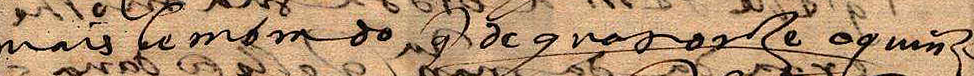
mais lembrado q̄ de quatorze o quinze
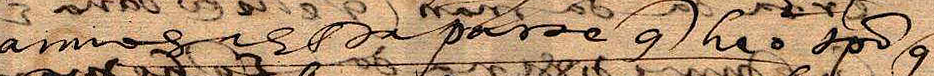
annos a Esta parte q̄ he o tpō q̄
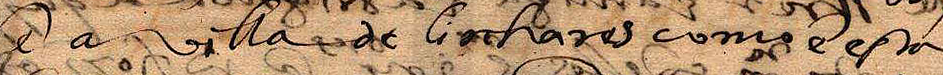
ē a villa de linhares como ē esta
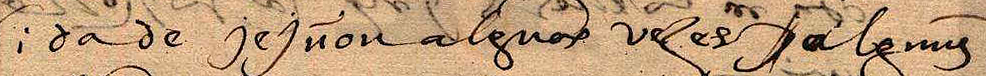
Cidade jeJūou algūas vezes j alguūs
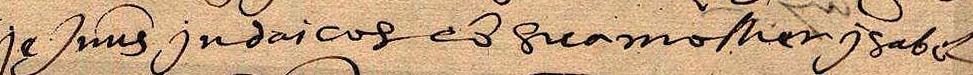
jeJuūs judaicos cō sua molher jsabel
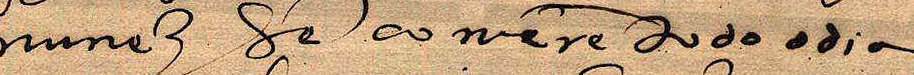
nunez sē comerē todo o dia
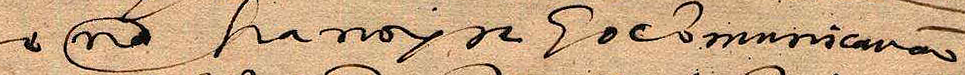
senā ha noyte E o cōmunicavaõ
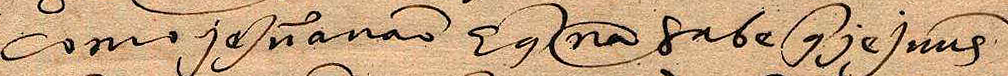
como jeJūauaõ E q̄ nā sabe q̄ jejuūs
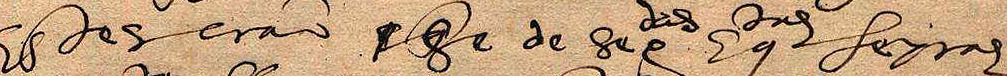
Estes eraõ _ se de segdas E qtas feyras
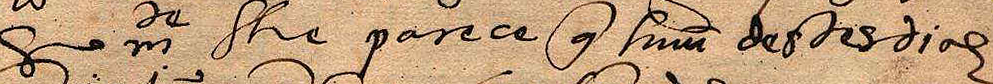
somte lhe parece q̄ huū destes dias
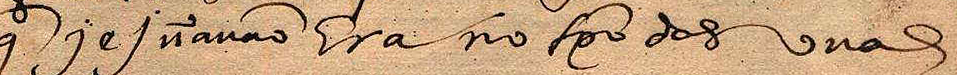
q̄ jejūauaõ Era no tpō das vuas
